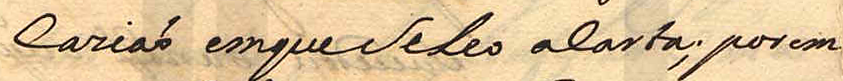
Caziaõ em que se Leo a Carta; porem
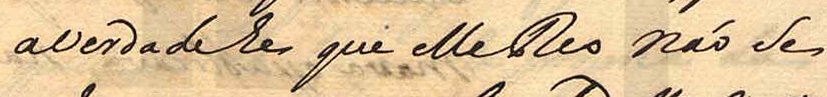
a verdade he que elle Reo naõ se
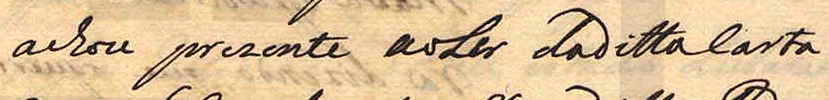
achou prezente ao Ler da ditta Carta
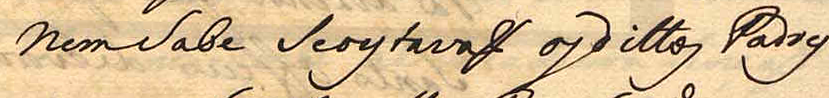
nem sabe se o estavaõ os dittos Padres
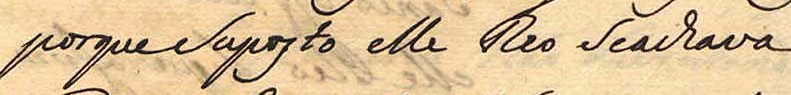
porque suposto elle Reo se achava
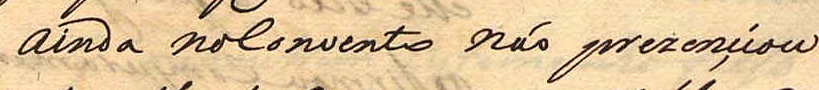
ainda no Convento naõ prezenciou
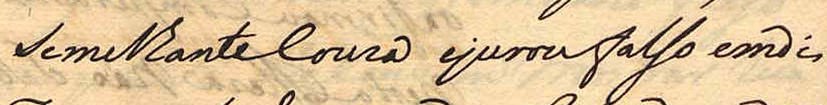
semelhante Couza e jurou falso em di
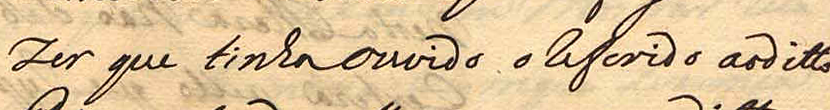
Zer que tinha ouvido o Referido ao ditto
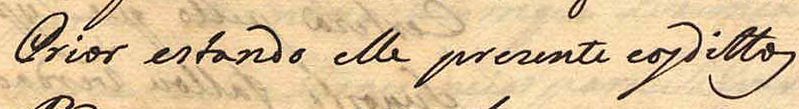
Prior estando elle prezente e os dittos
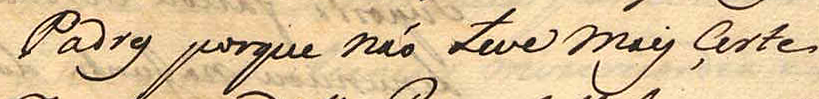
Padres porque naõ teve mais certe
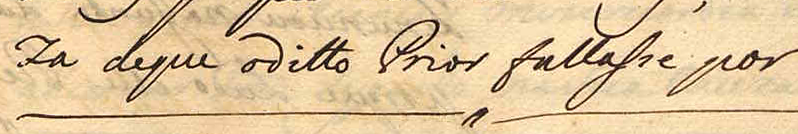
Za de que o ditto Prior fallasse por
